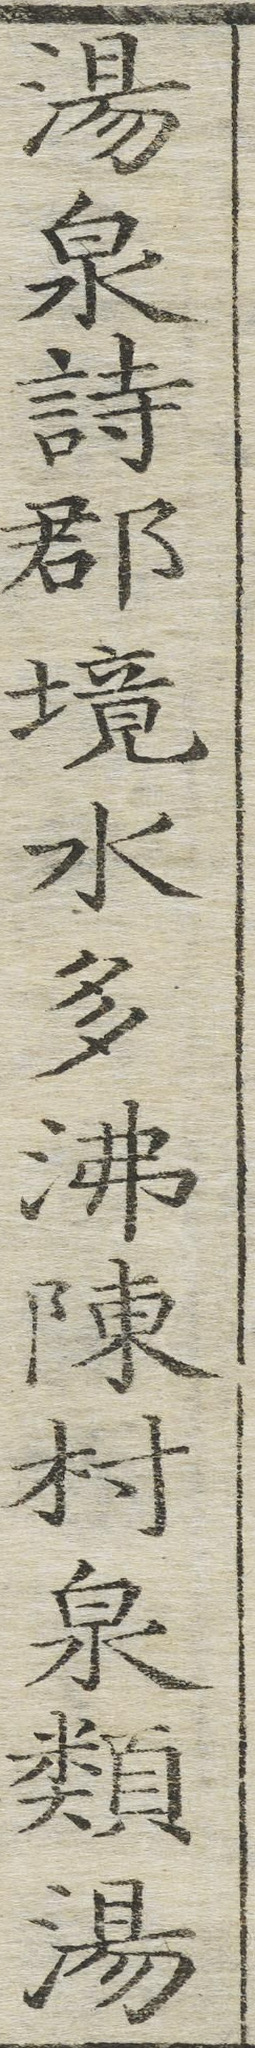湯泉詩郡境水多沸陳村泉類湯
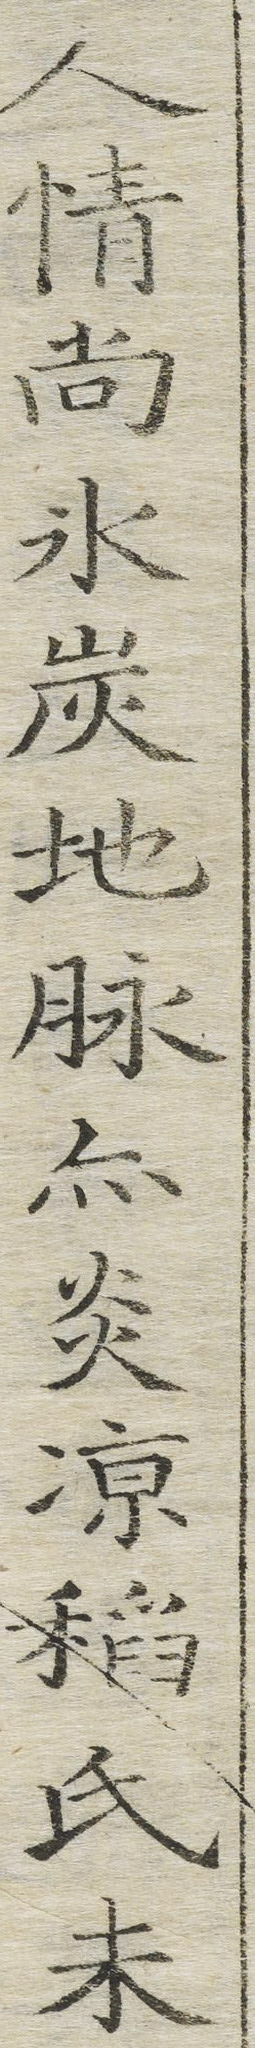人情尚氷炭地脉亦炎凉稻氏未
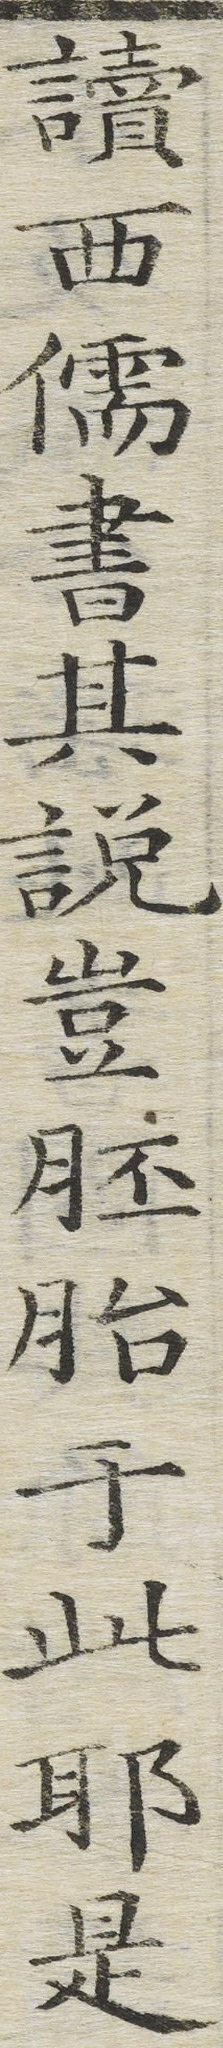讀西儒書其說豈胚胎于此耶是
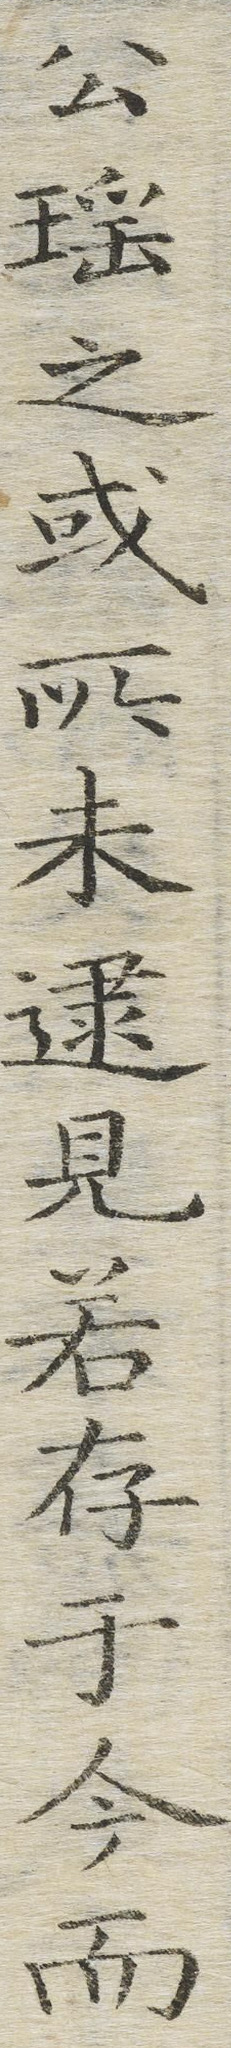公瑤之或所未逮見若存于今而
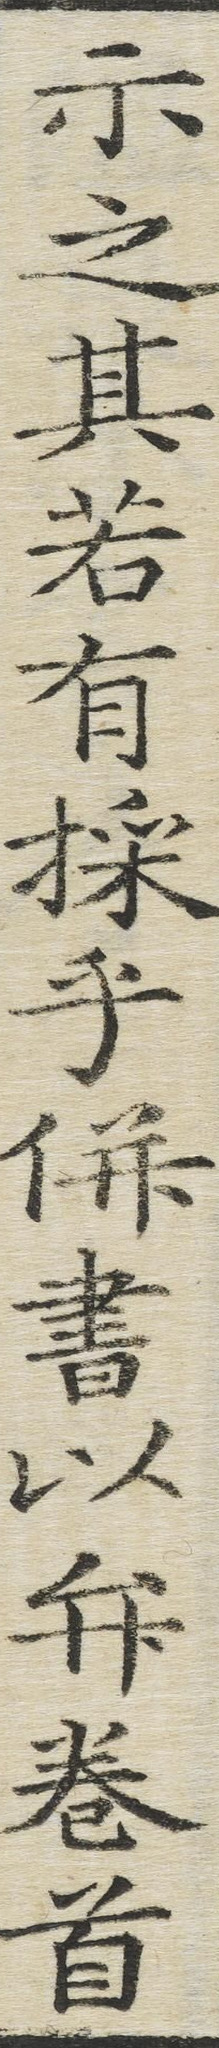示之其若有採乎併書以弁卷首
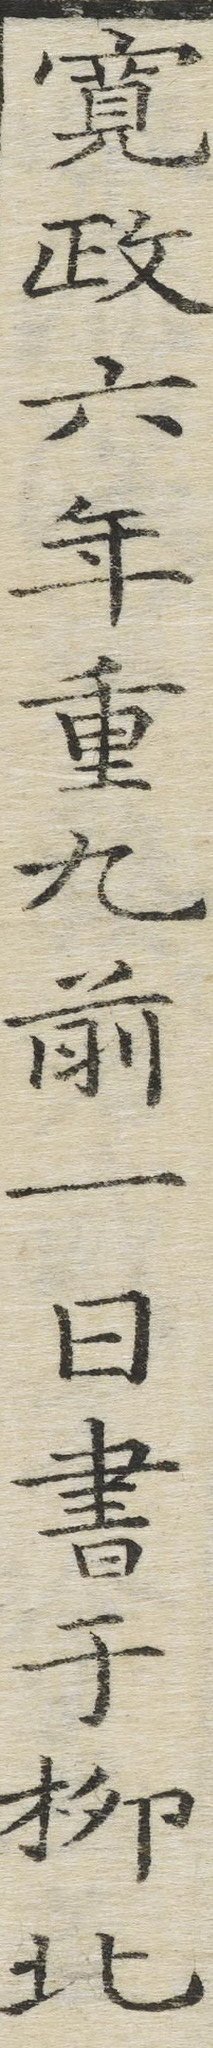寬政六年重九前一日書于栁北
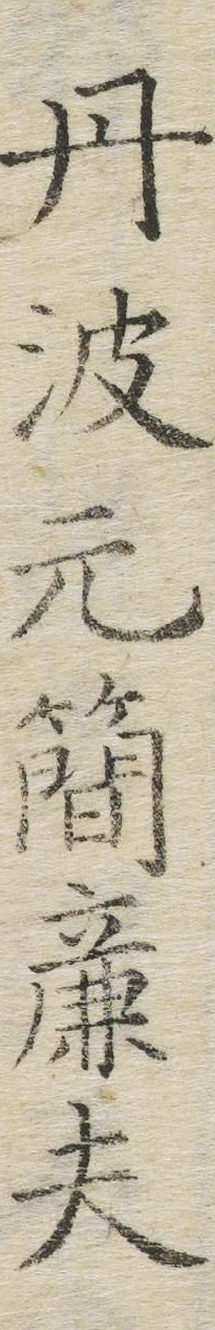丹波元簡廉夫

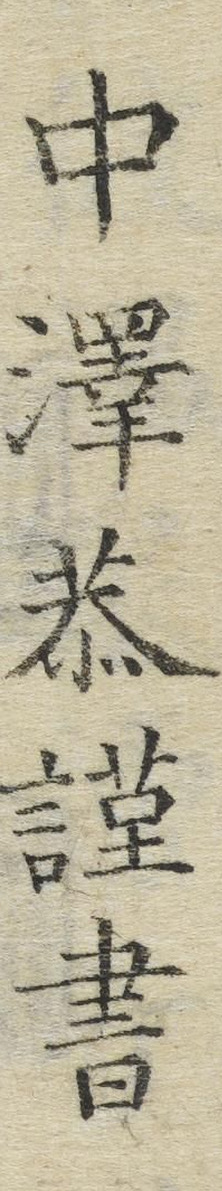中澤恭謹書
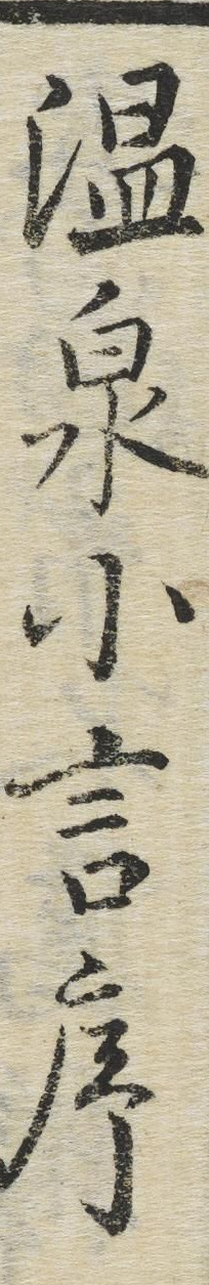温泉小言序
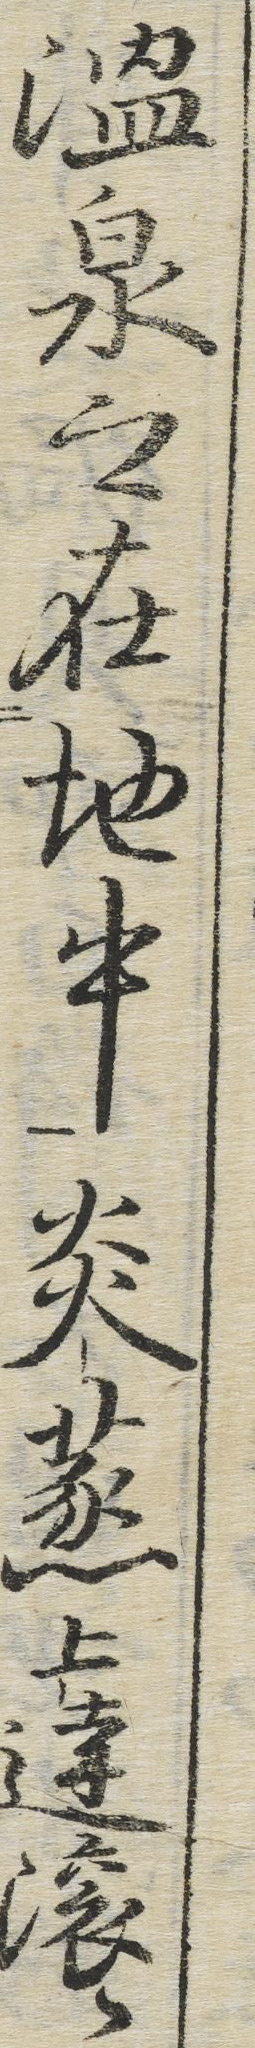温泉之在地中炎蒸上達滾々

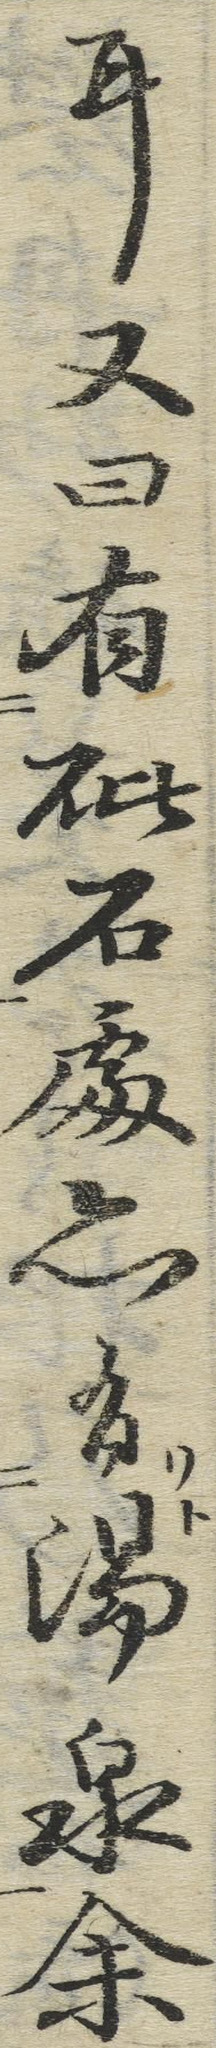耳又曰有砒石処亦有湯泉余
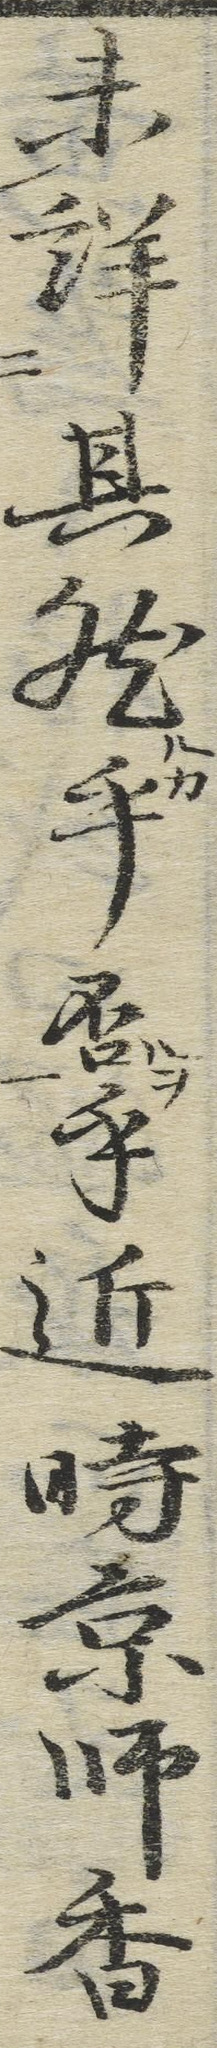未詳其然乎否乎近時京師香
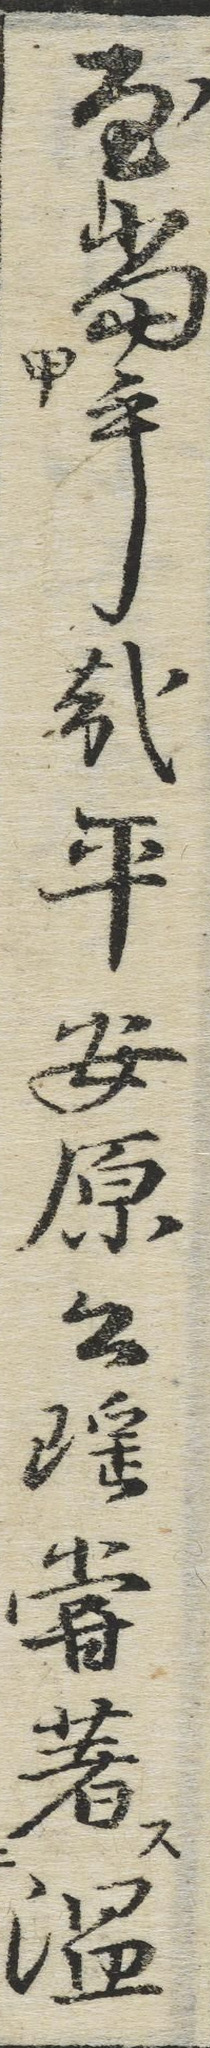至当乎哉平安原公瑶嘗著温
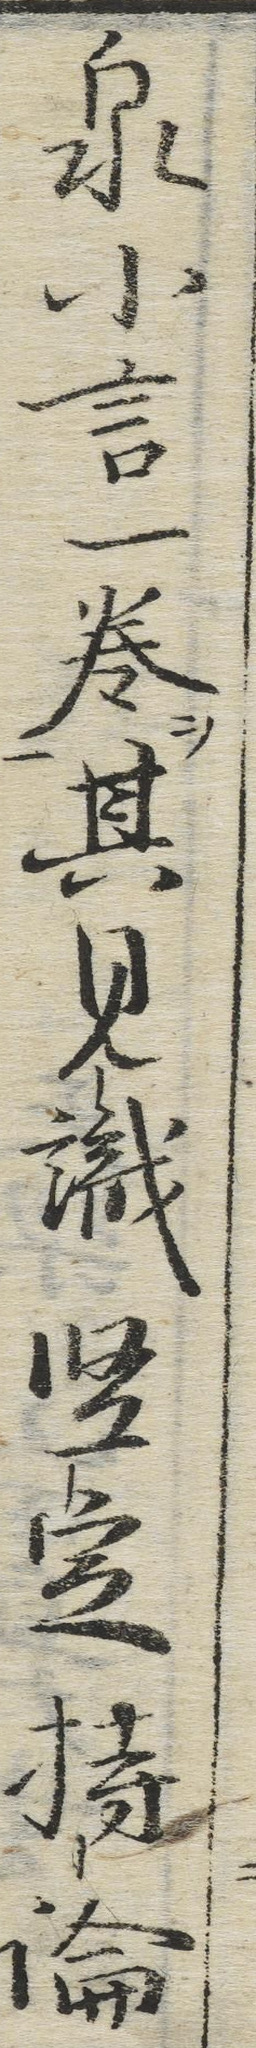泉小言一巻其見識堅定持論
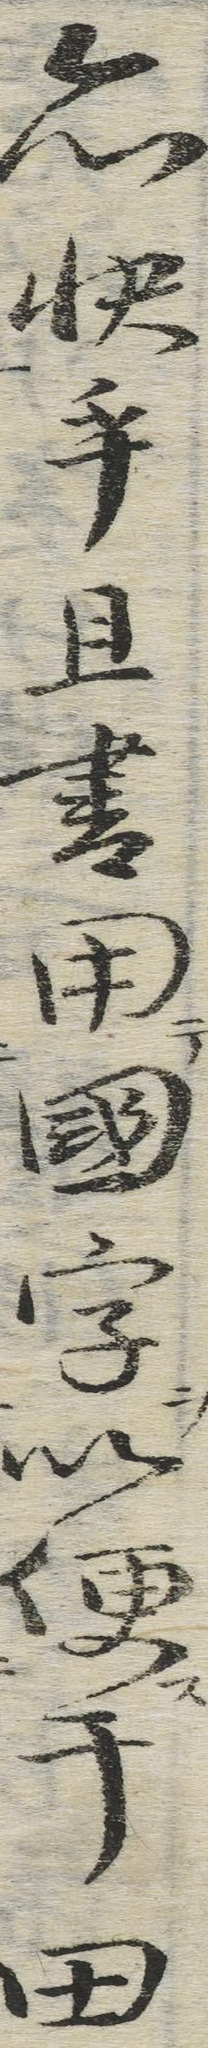亦快乎且書用国字以便于田
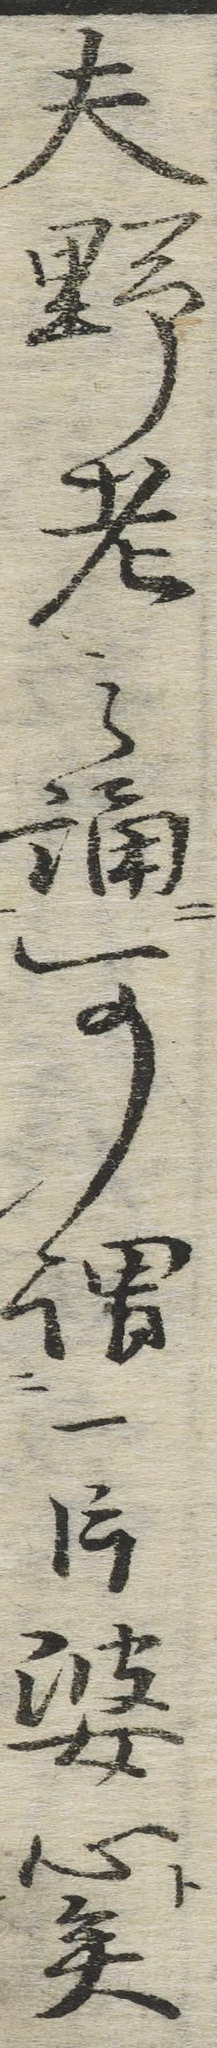夫野老之誦可謂一片婆心矣
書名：温泉考
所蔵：東京大学地震研究所図書室 Earthquake Research Institute Library, The University of Tokyo, JAPAN
